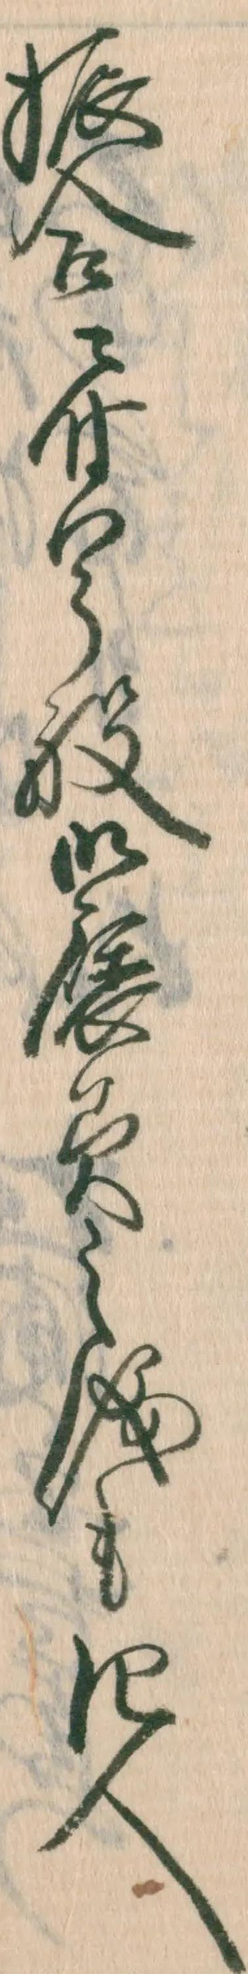振合ニ付今般御褒美之儀も四人
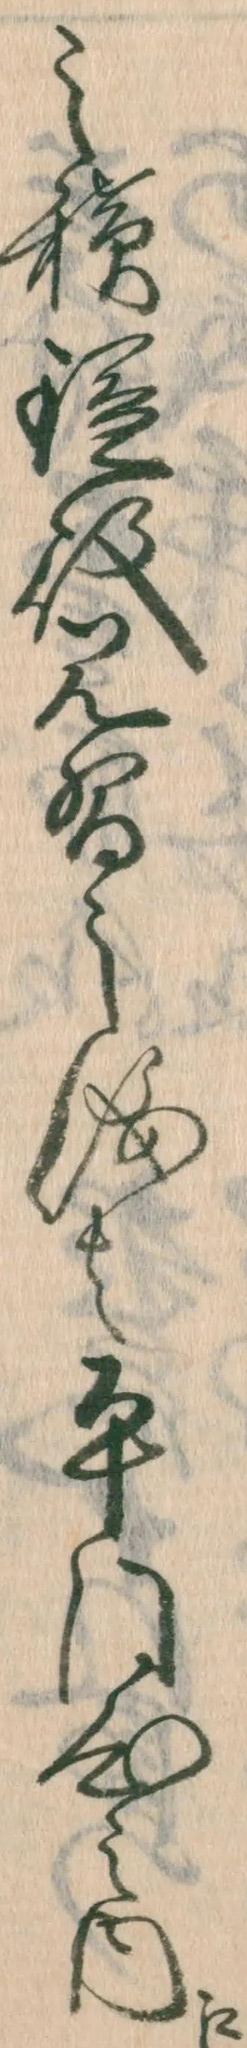之積鎰役見習之儀は日ら同心之内え
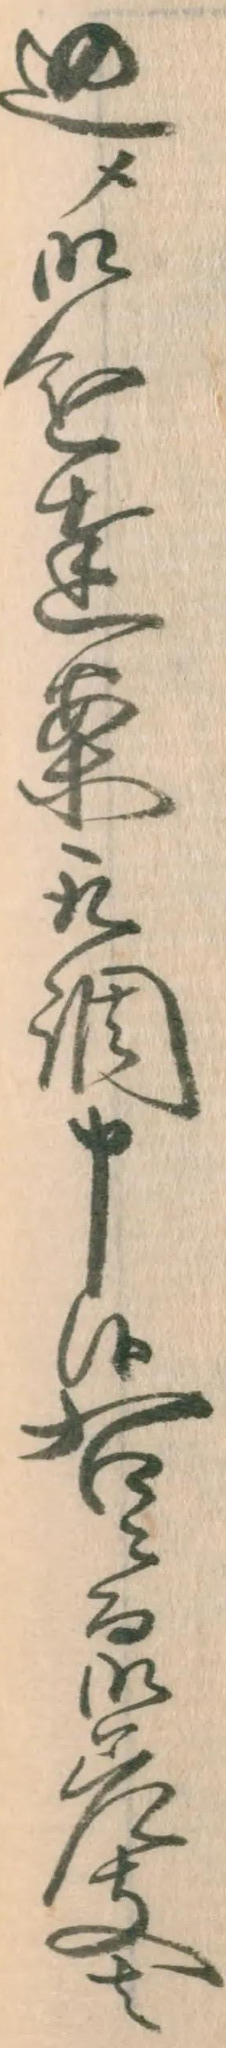込メ御進達案取調申候右ニて御差支は
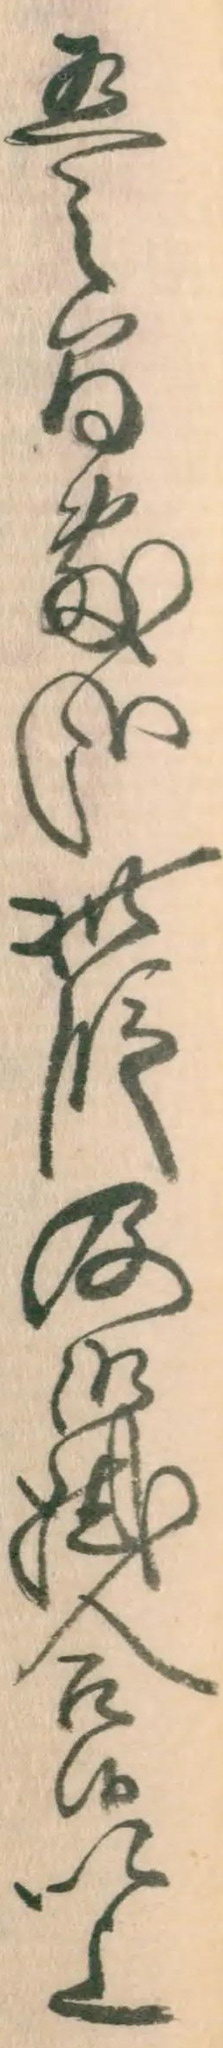有之間敷哉此段及御掛合候以上
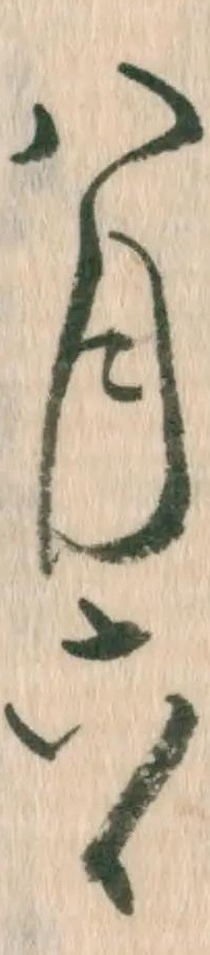八月六日

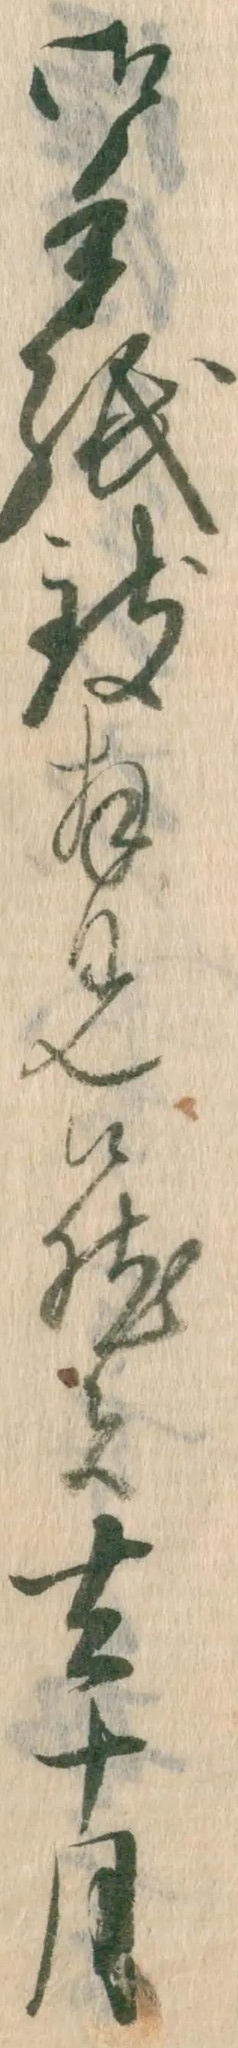御手紙致拝見候然は去十月
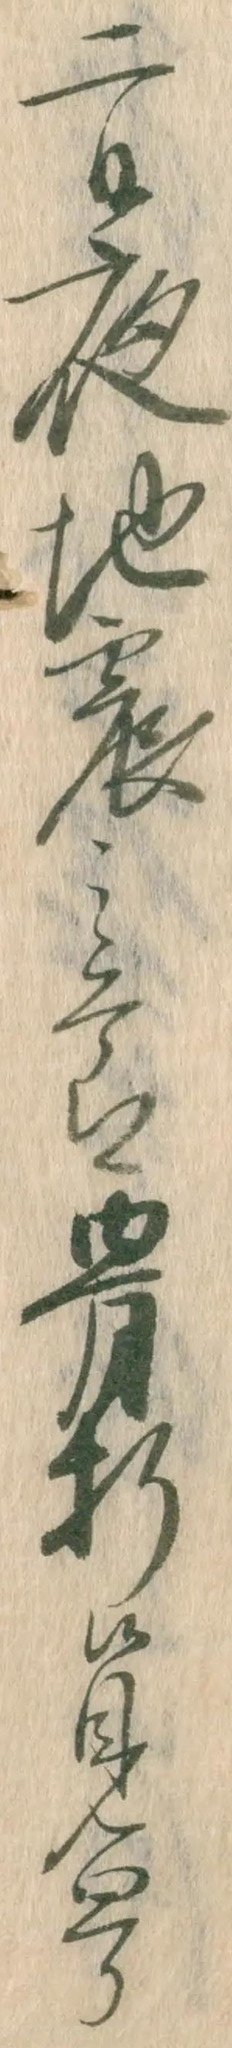二日夜地震之節骨折候見廻り

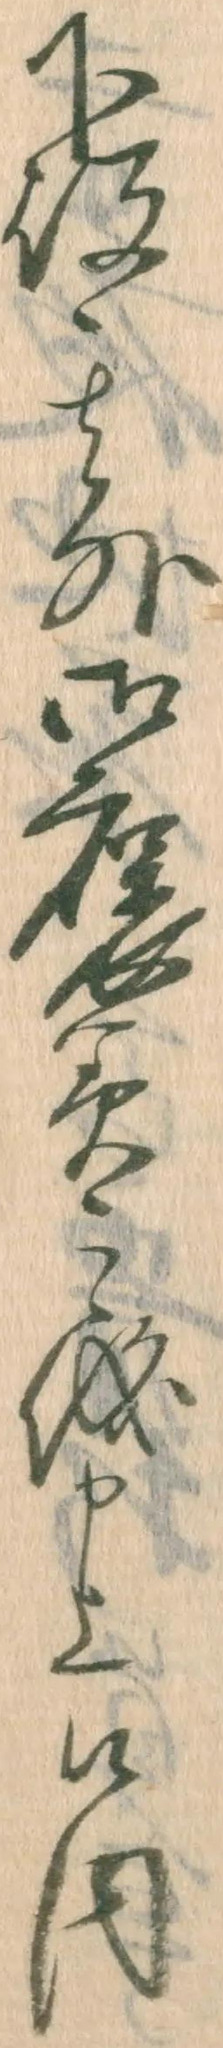下役其外御褒美之儀申上候内
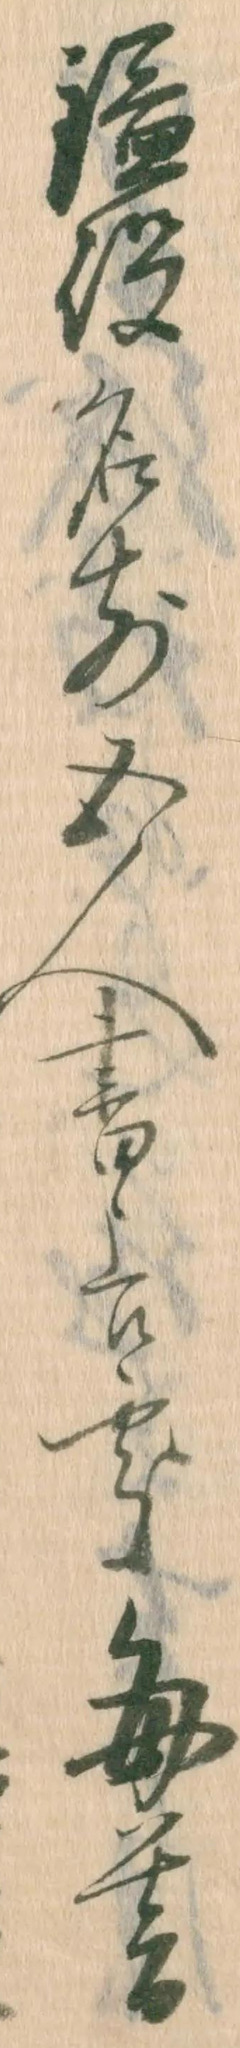鎰役名前五人書上候処毎暮
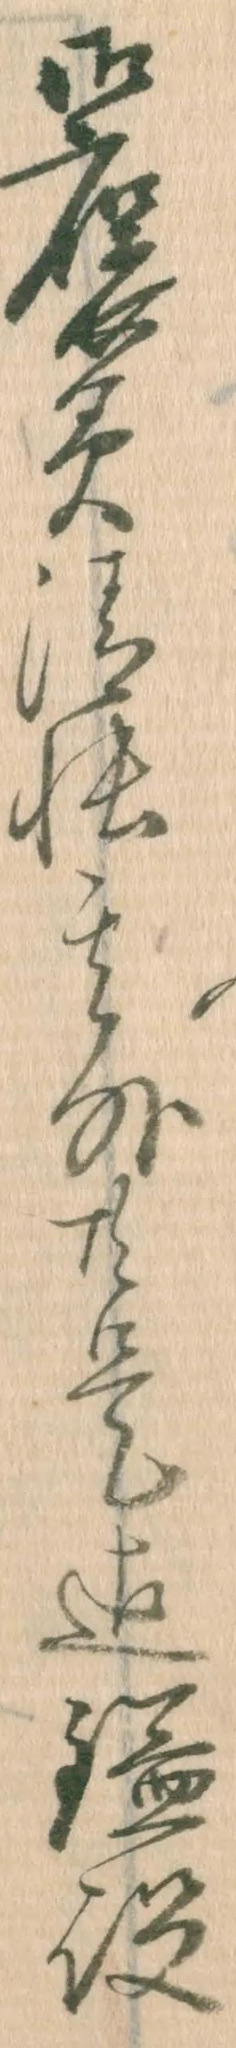御褒美請帳其外共是迄鎰役
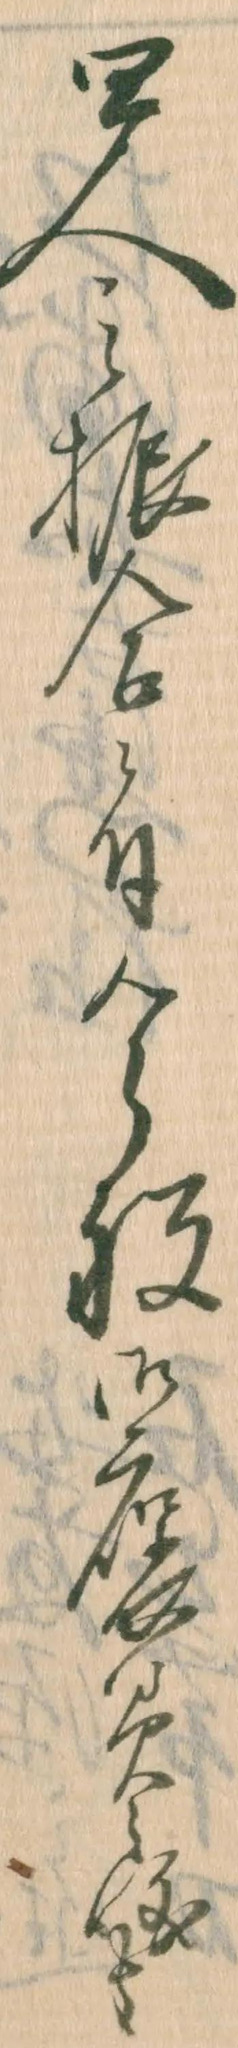四人之振合ニ付今般御褒美之儀は
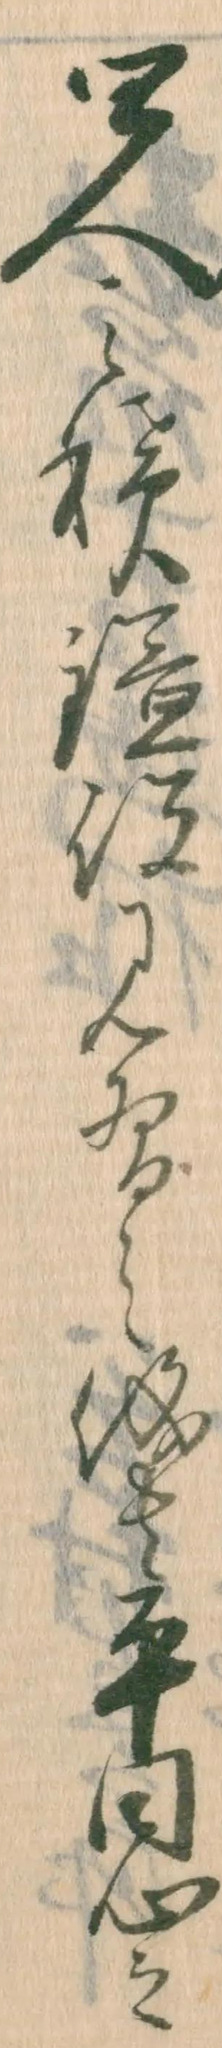四人之積鎰役見習之儀は平同心之
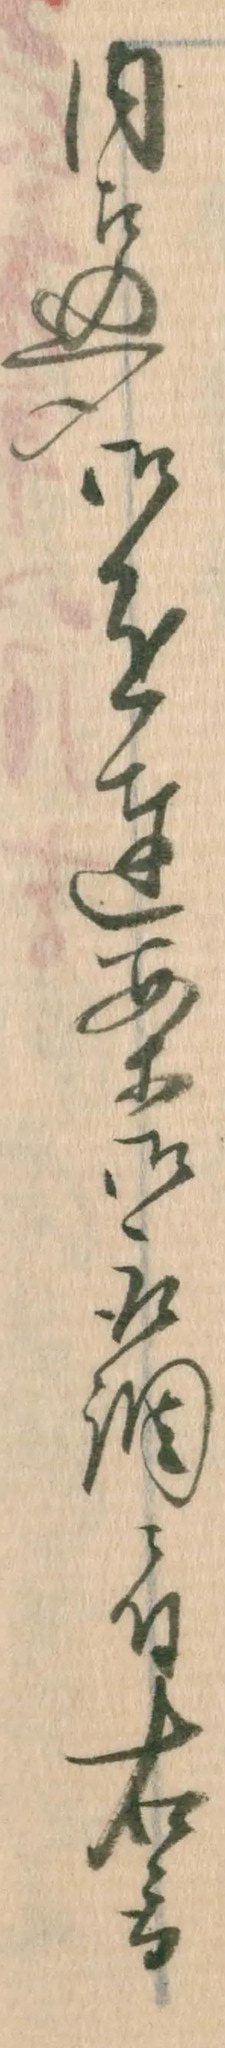内え込メ御進達案御取調ニ付右ニて
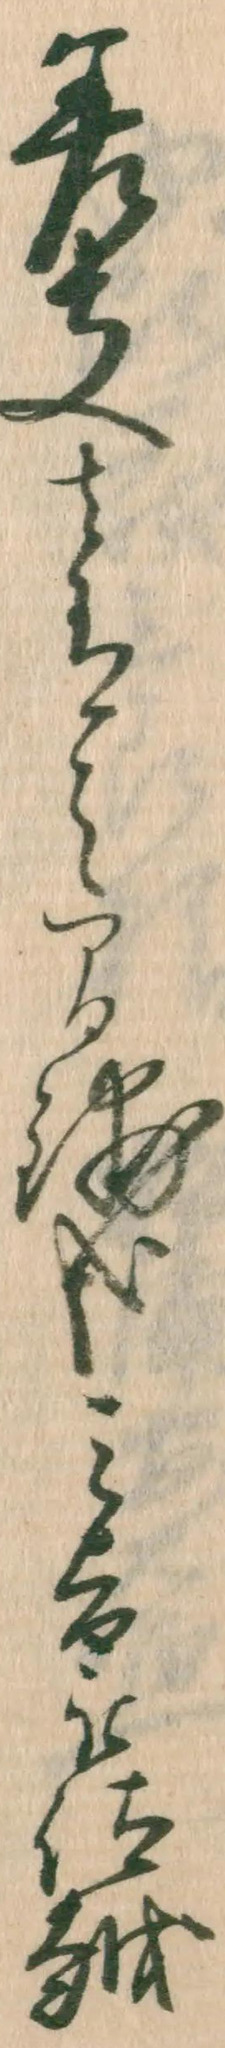差支は有之間鋪哉之旨被仰越
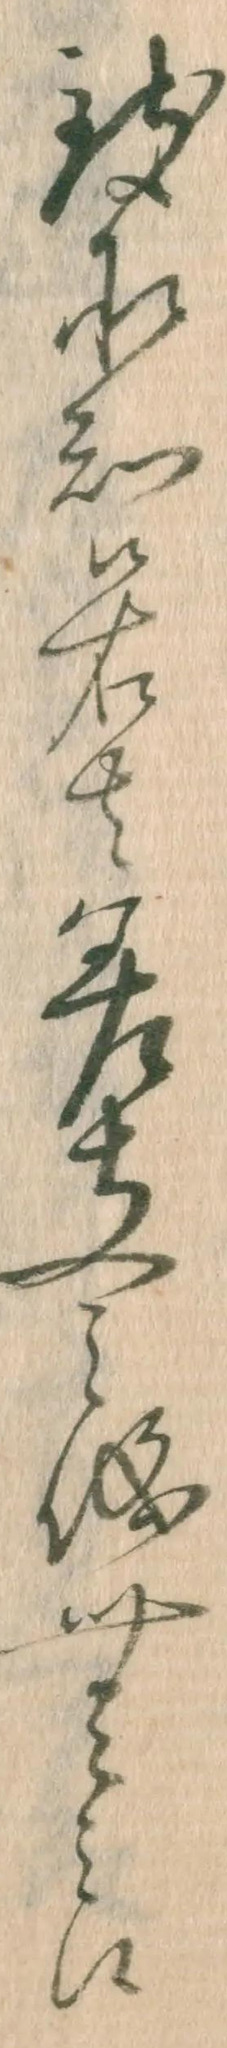致承知候右は差支之儀無之候
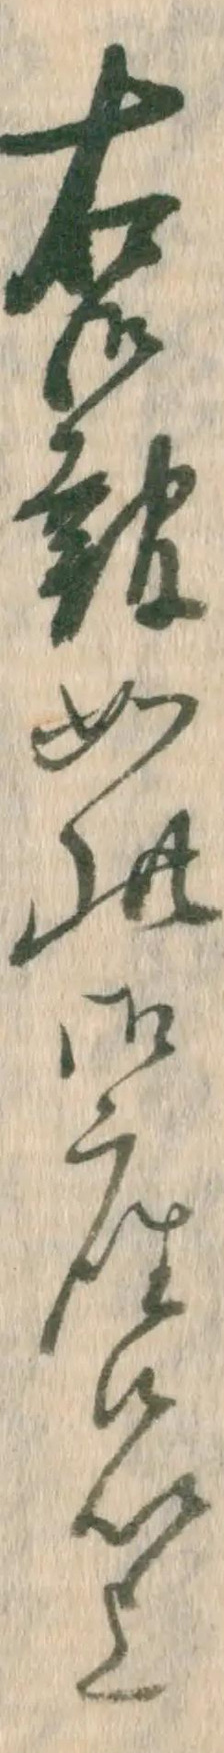右御報如此御座候以上
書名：七十冊物類集 71巻. [44] 四十三 牢屋敷御普請御修覆地震ニ付骨折候牢屋掛御褒美之部
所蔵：国立国会図書館 National Diet Library, JAPAN
